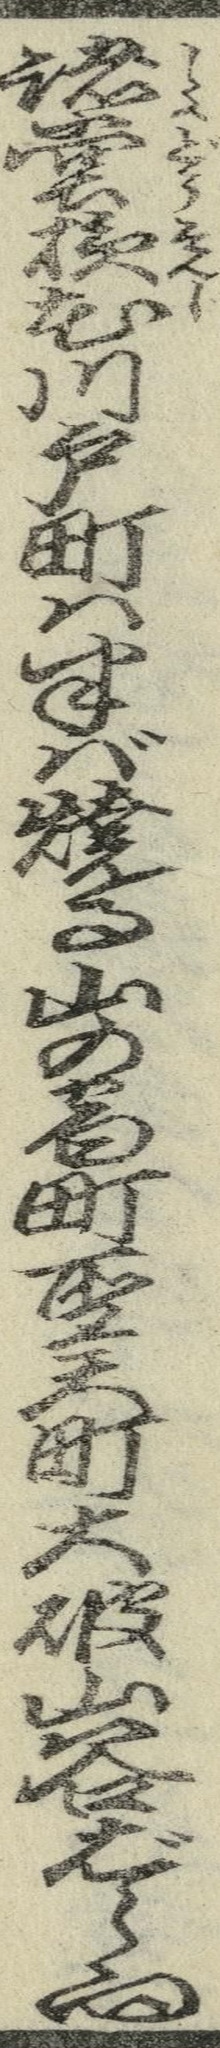諸堂損花川戸町は半ば焼る山の宿町聖天町大破山谷ばゝ向
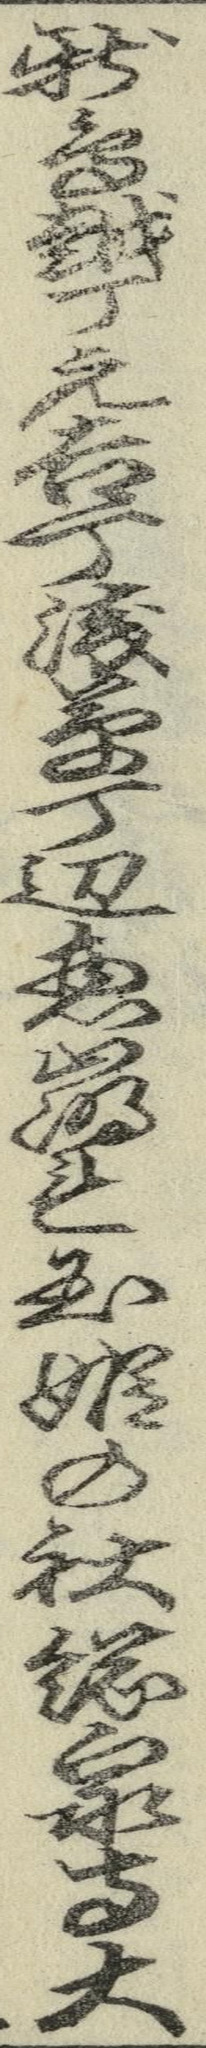新鳥越丁元吉丁浅草丁辺惣崩れ玉姫の社総泉寺大
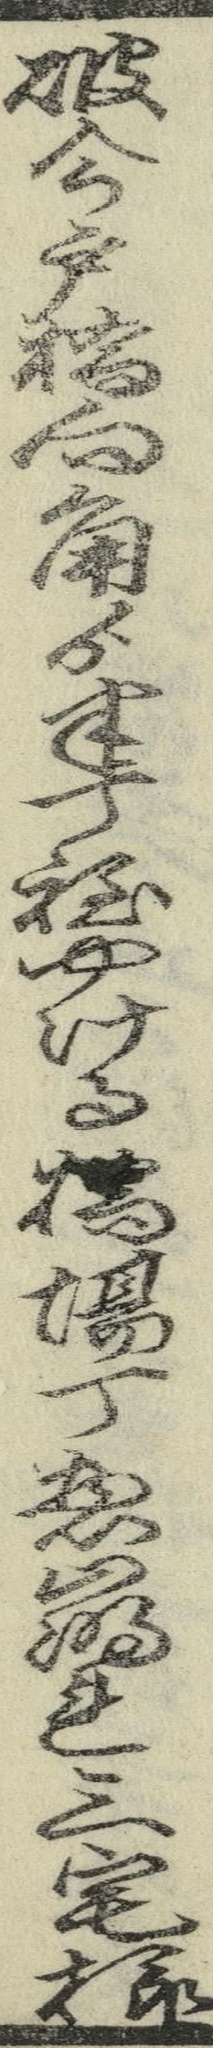破今戸橋向角ゟ半丁程やける橋場丁惣崩れ三宅様
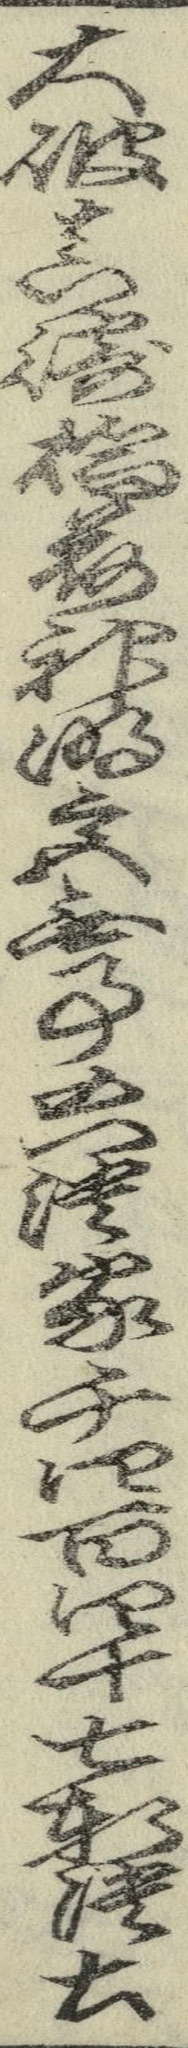大破真崎稲荷神明宮無事かつ潰家千四百十七軒潰土
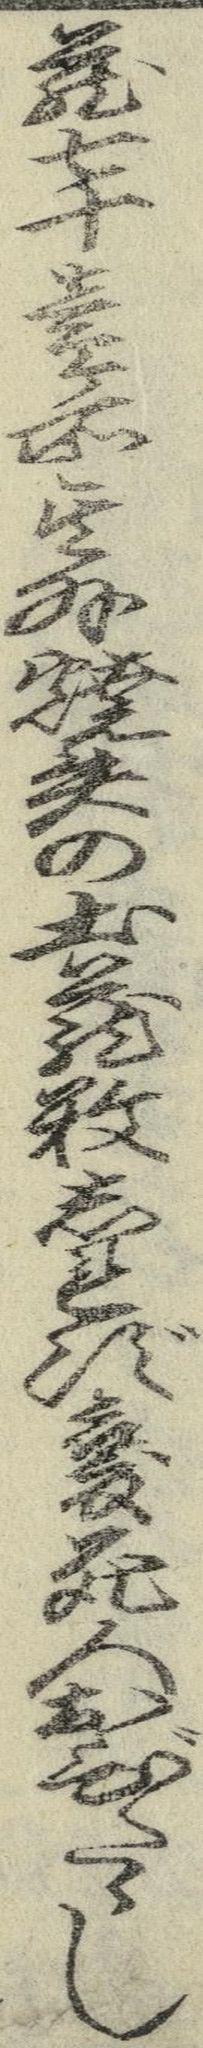蔵七十壱ケ所其外焼失の土蔵数しれず変死人おびたゝし
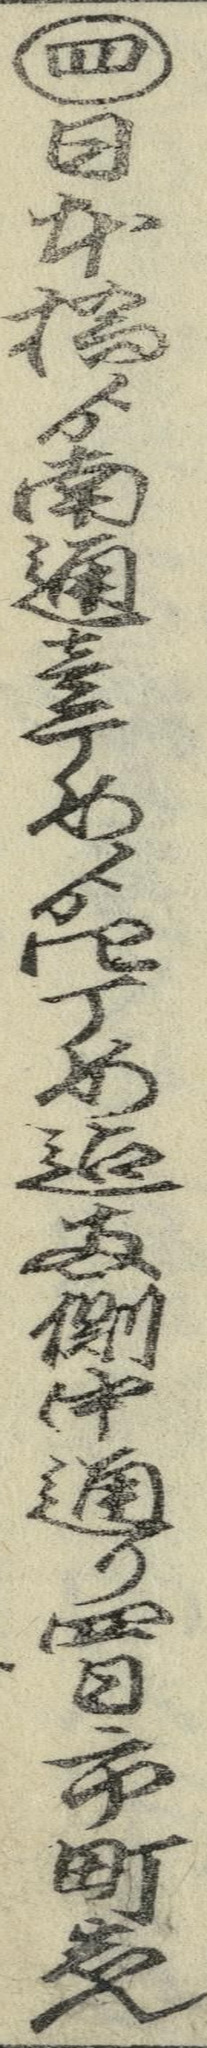㊃日本橋ゟ南通壱丁めゟ四丁め迄両側中通り四日市町しん
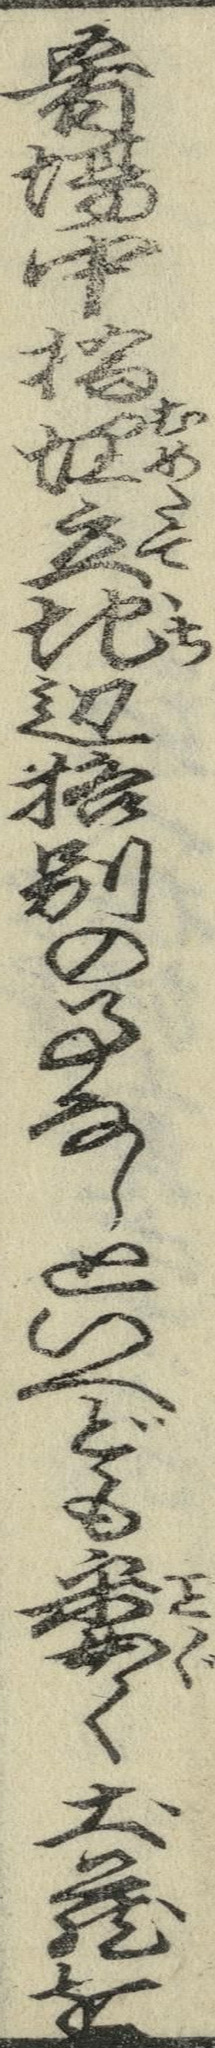肴場中橋埋立地辺格別の事なしといへども悉く土蔵を

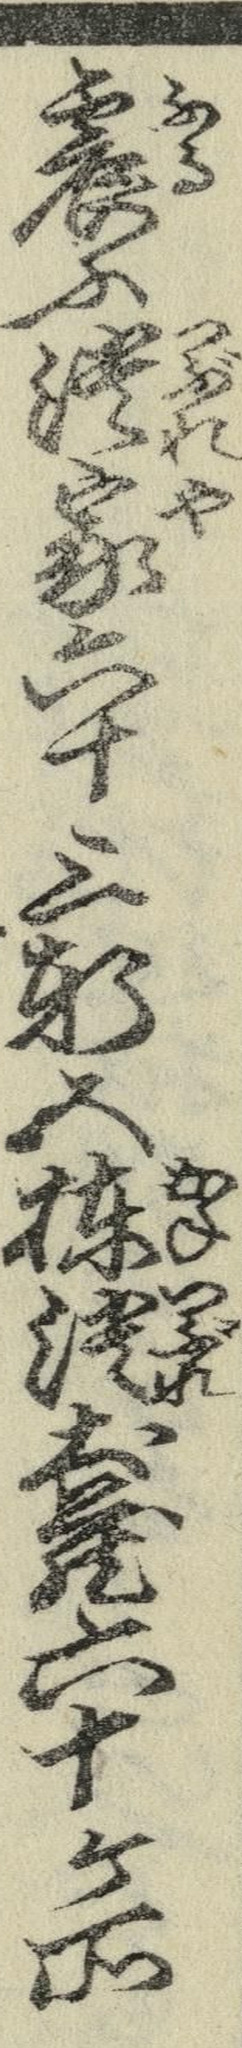震ふ潰家六十三軒五棟潰土蔵六十ケ所
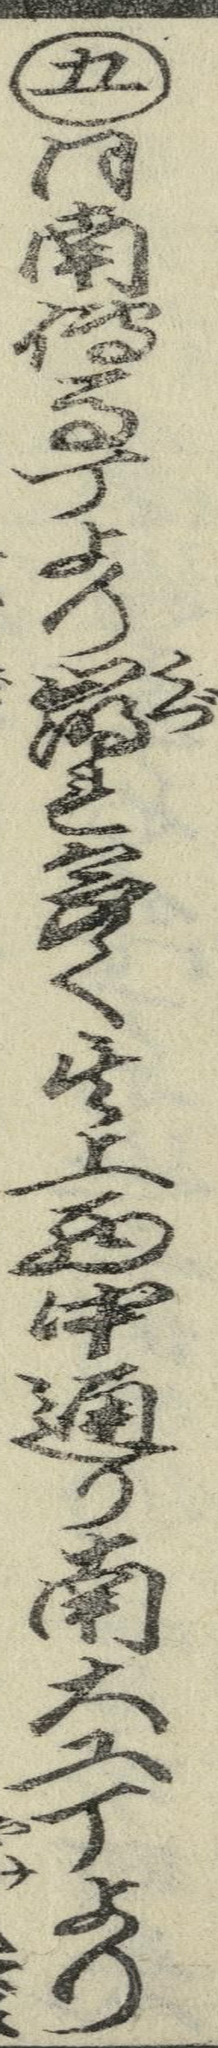㊄同南伝馬丁より崩れ多く其上西中通り南大工丁より
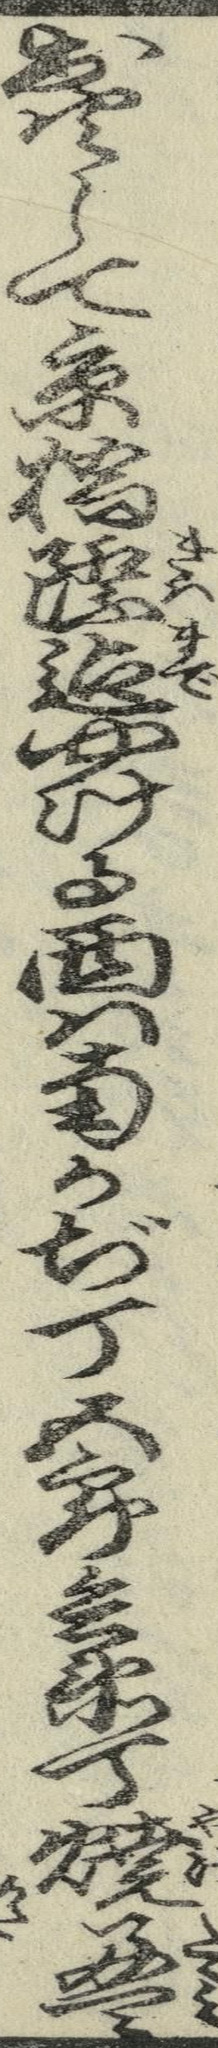出火して京橋際迄やける西は南かぢ丁五郎兵衛丁焼畳
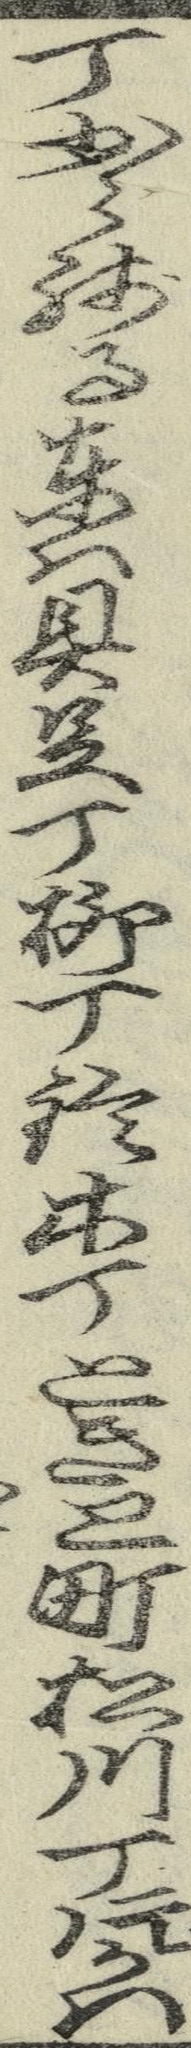丁少々残る東は具足丁柳丁鈴木丁ときわ町松川丁片かは
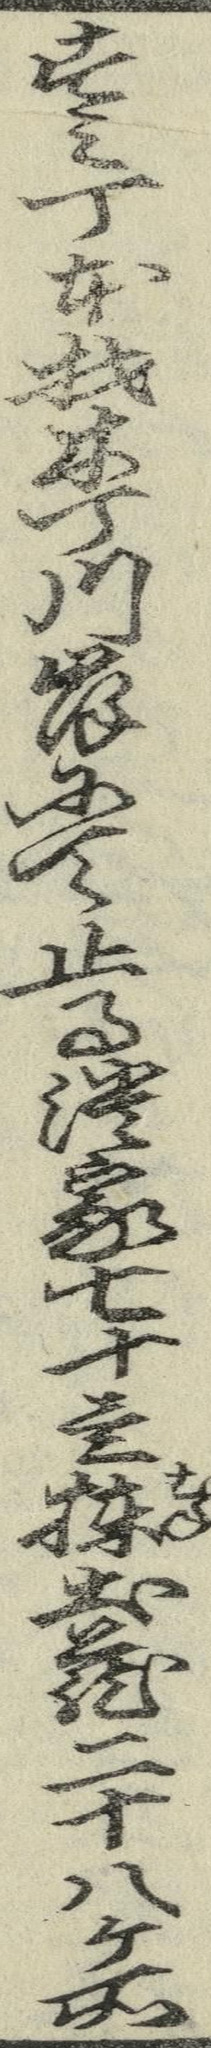すみ丁本材木丁川岸にて止る潰家七十壱棟土蔵二十八ケ所
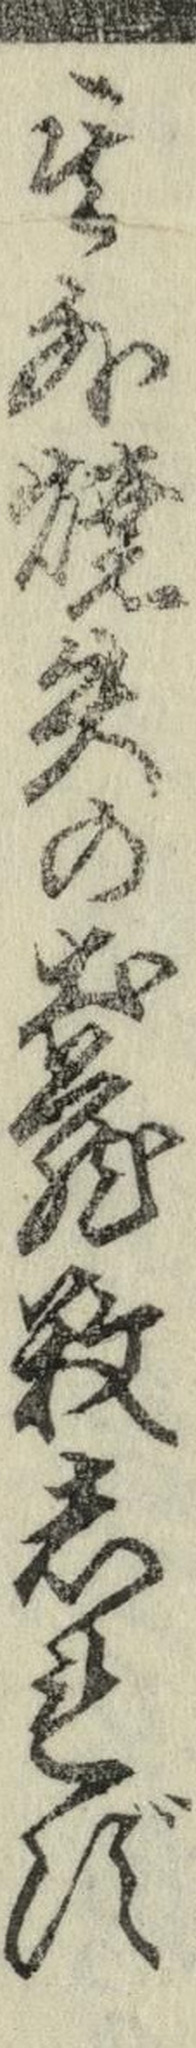其外焼失の土蔵数しれず
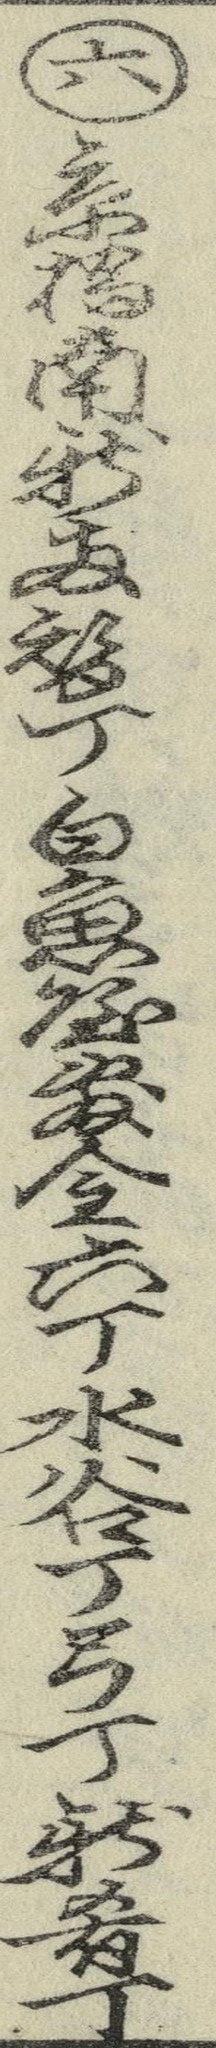㊅京橋南新両替丁白魚屋敷金六丁水谷丁弓丁新肴丁
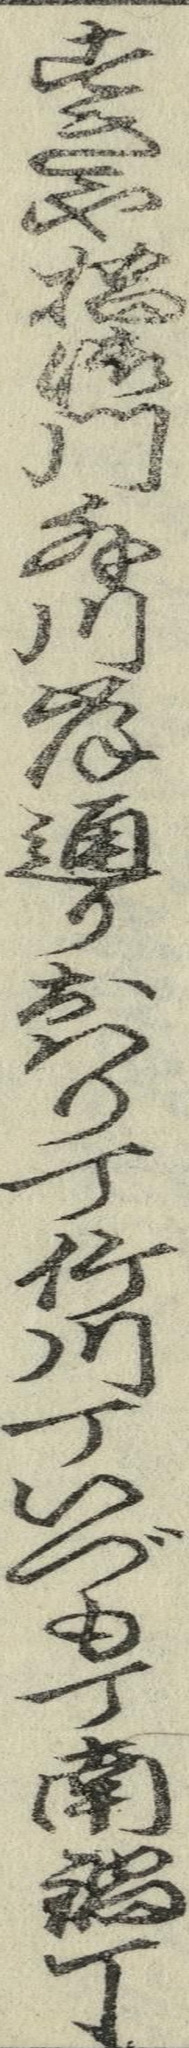すきや橋御門外川岸通りおはり丁竹川丁いづも丁南鍋丁
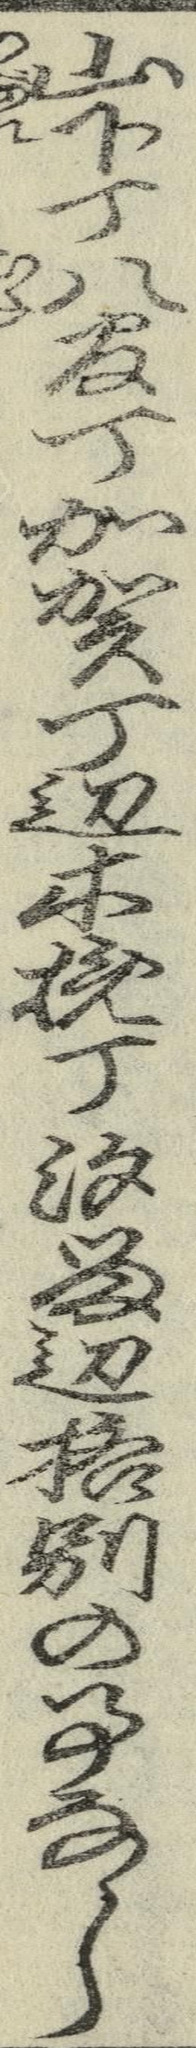山下丁八間丁加賀丁辺木挽丁汐留辺格別の事なし
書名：地震年代記
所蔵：東京大学地震研究所図書室 Earthquake Research Institute Library, The University of Tokyo, JAPAN
